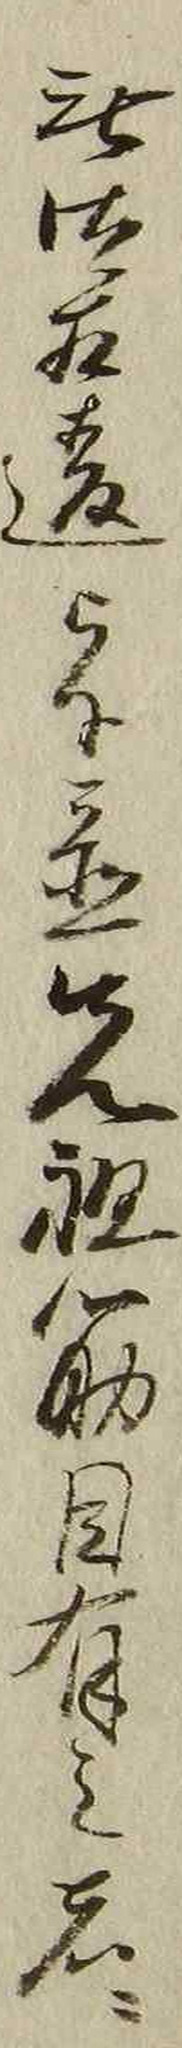無御相違被下置先祖筋目有之者ニ
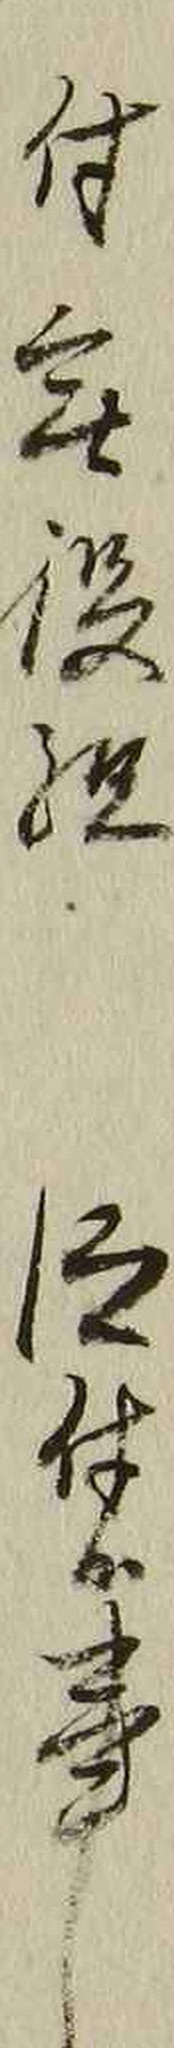付無役組仰付候事
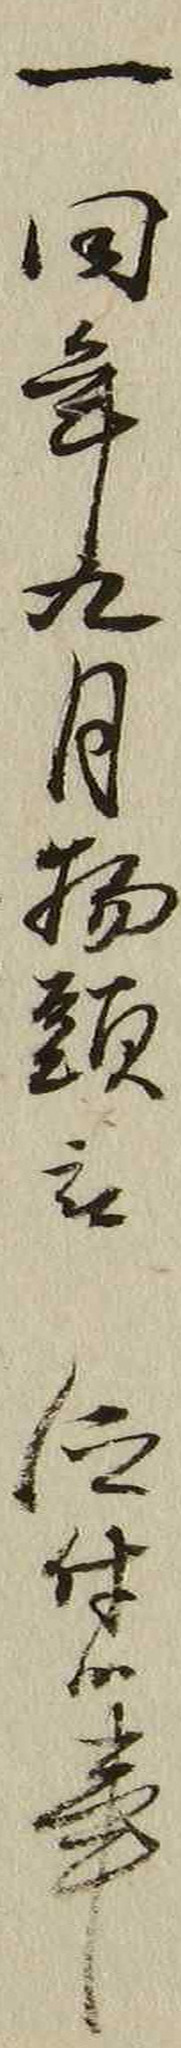一同年九月物頭被仰付候事
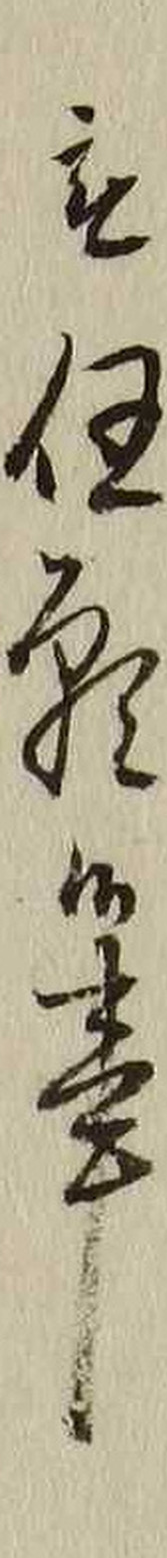被任願候事
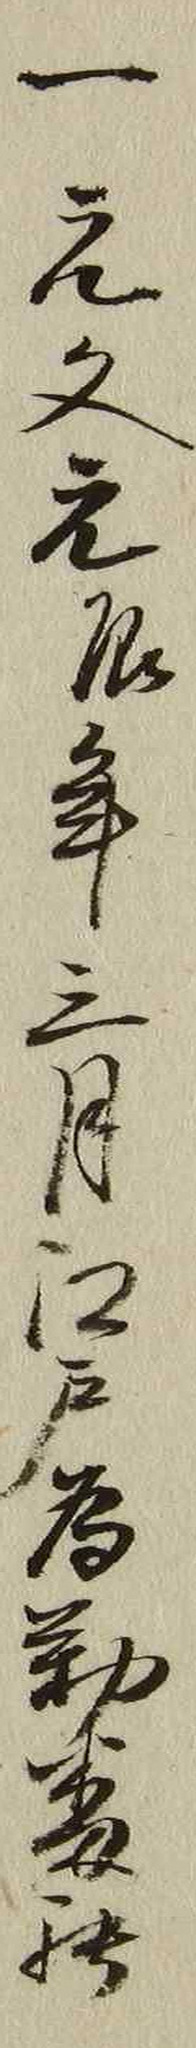一元文元辰年三月江戸為勤番罷
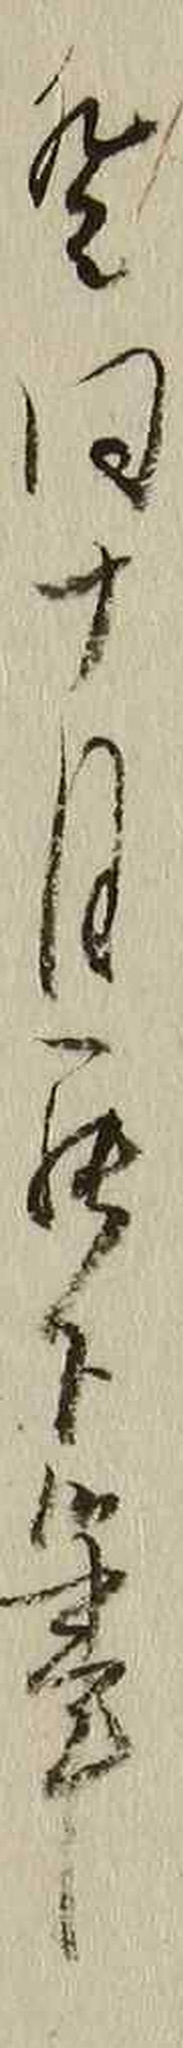登同十月罷下候事
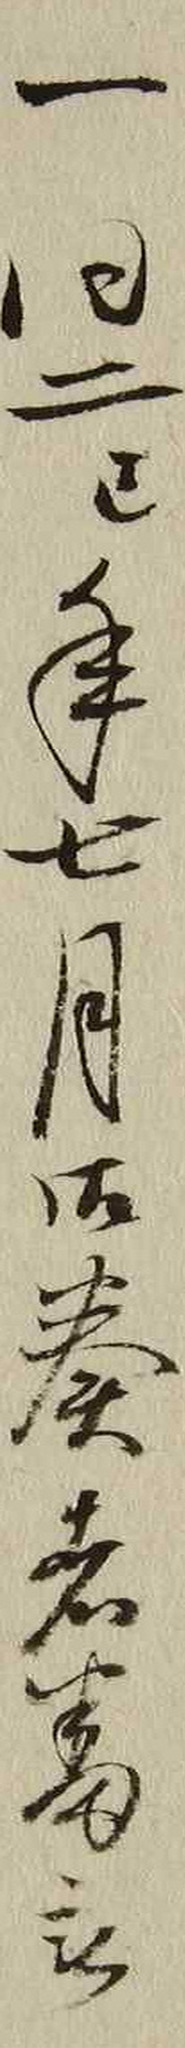一同二巳年七月御奏者番被
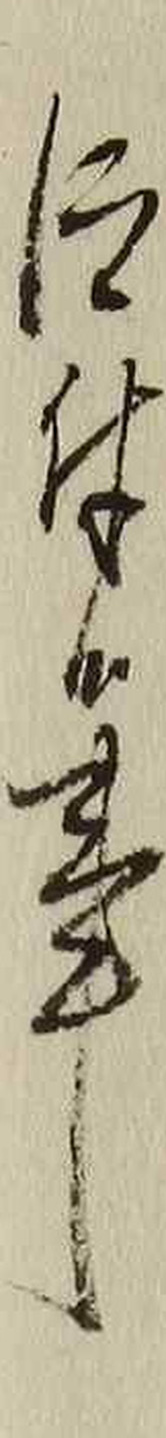仰付候事
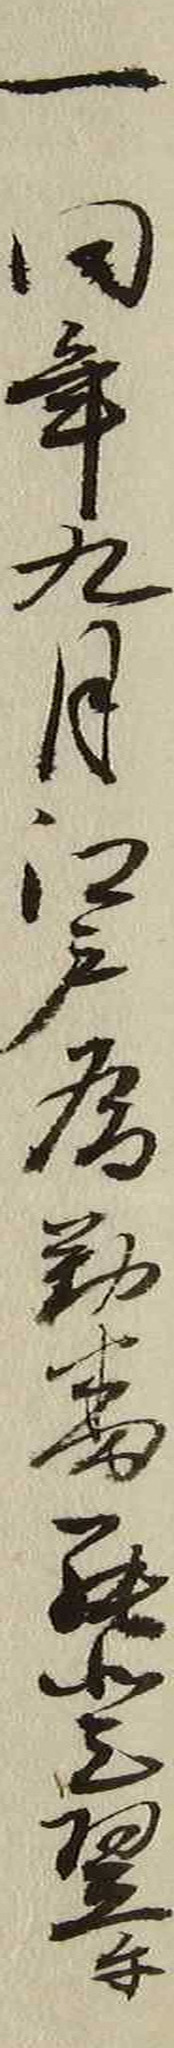一同年九月江戸為勤番罷登翌午
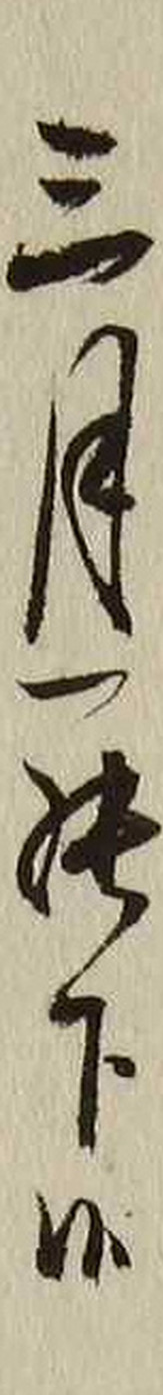三月罷下候
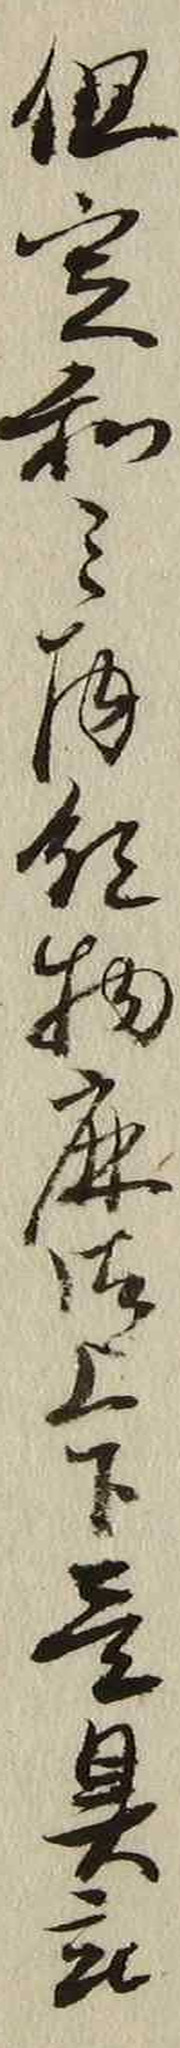但定和之拝領物麻御上下壱具被
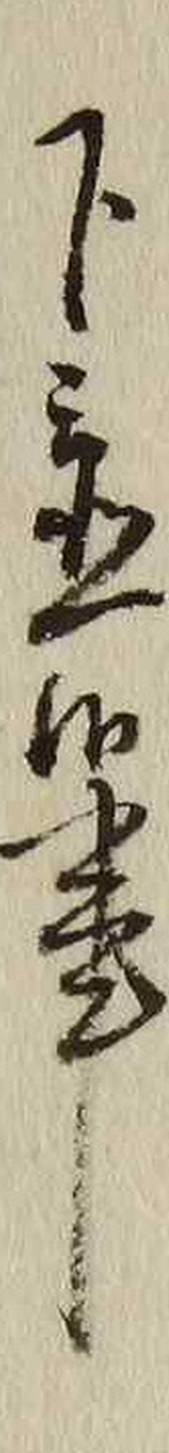下置候事
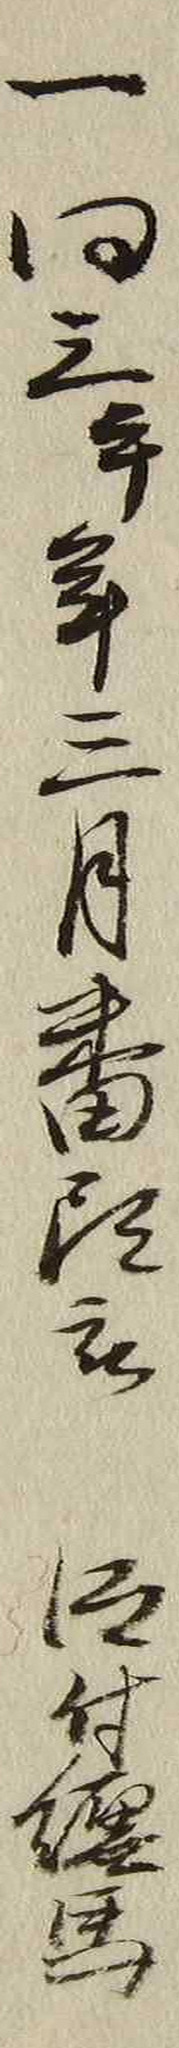一同三午年三月番頭被仰付纏馬
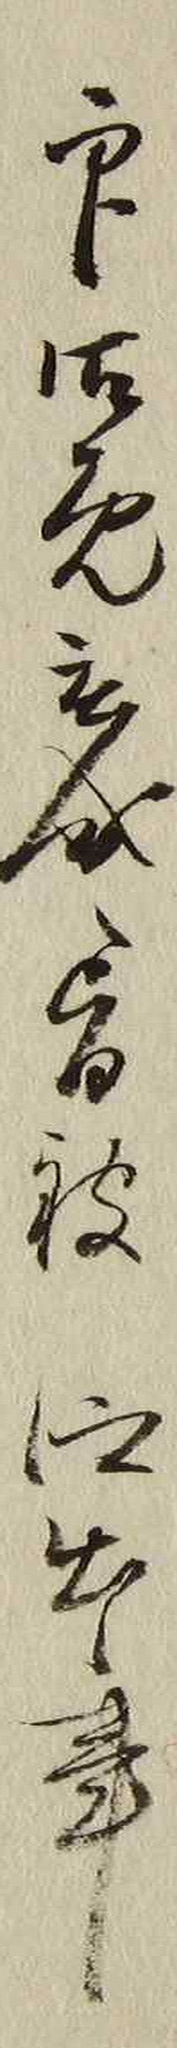印御免被成候旨被仰出候事
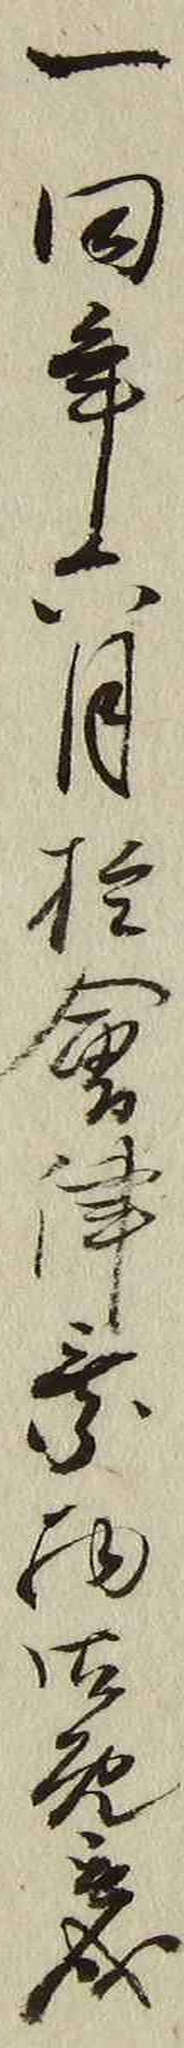一同年六月於会津乗物御免被成
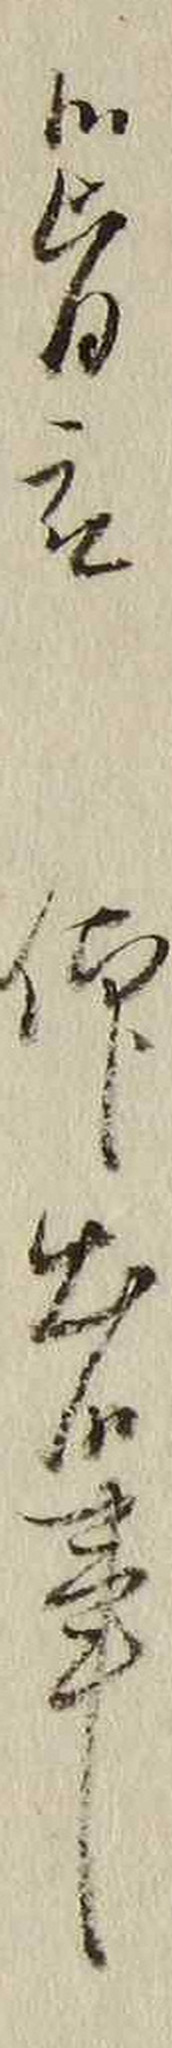候旨被仰出候事
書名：諸士系譜　巻之351　す之部1
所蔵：会津若松市立会津図書館
